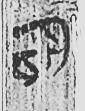明
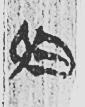於
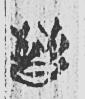晉
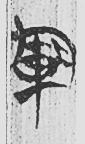軍
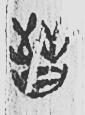晉
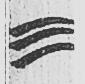三
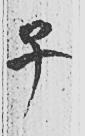子
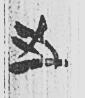之
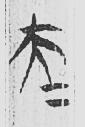夫=
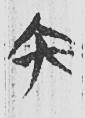內
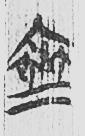齊
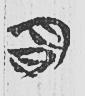明
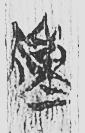陳
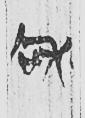和
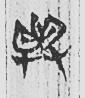與
